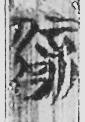辟
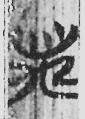萬
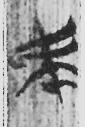民
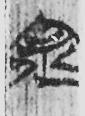余
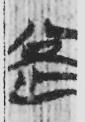罔
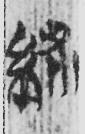絉
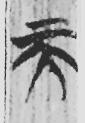天
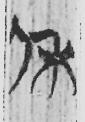休
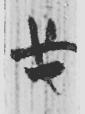弋
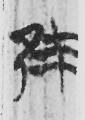隹
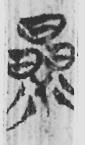參
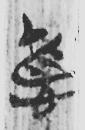惪
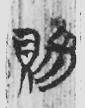賜
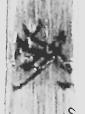我
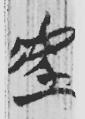𫊟（吾）
